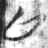㠯（以）
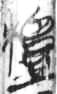樹木
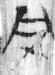凡
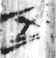五
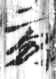亥
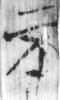不
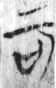可
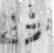㠯（以）
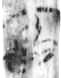畜
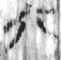六
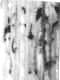牲
